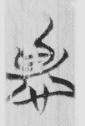{勺皿}
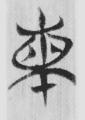柬
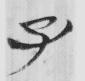子
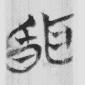䎽
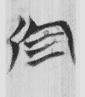於
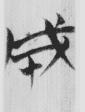成
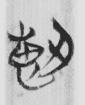{叀刃}
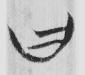曰
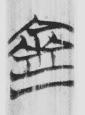齊
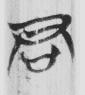君
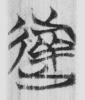{辶止㚔}
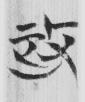政
